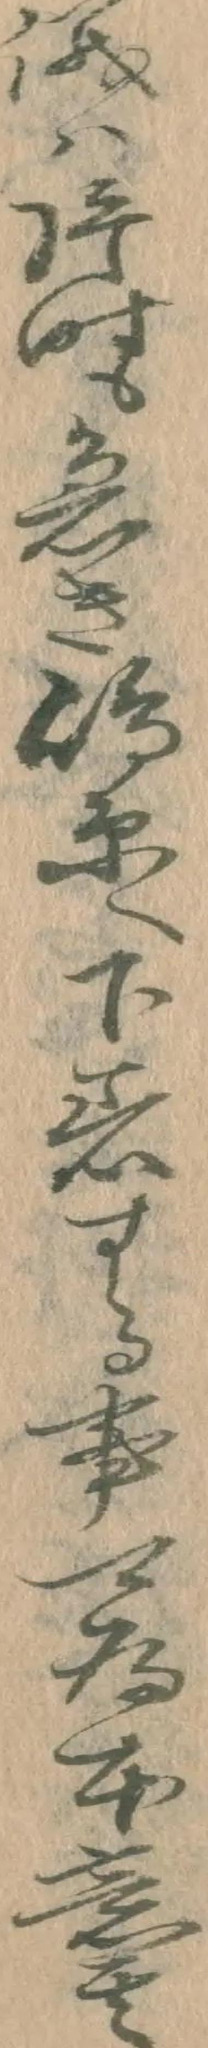儀は片時も急き島原へ下着する事可為本意其
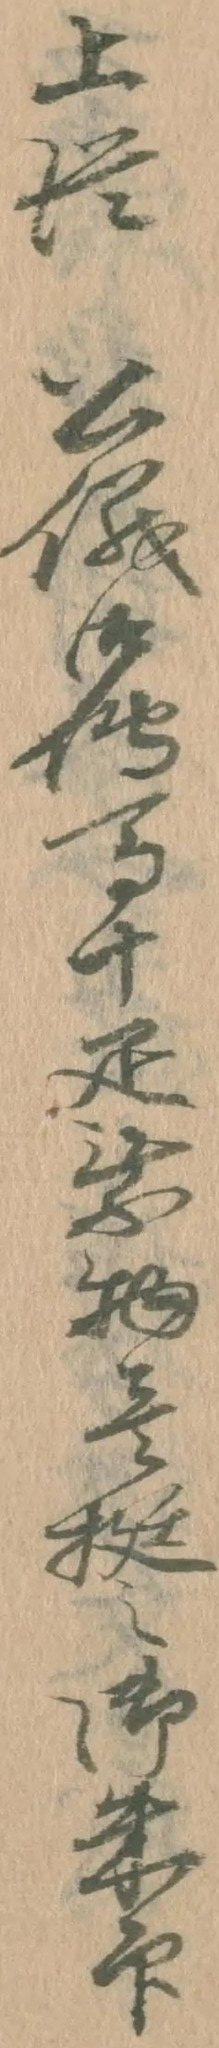上猶公儀御伝馬十疋乗物壱挺之御朱印
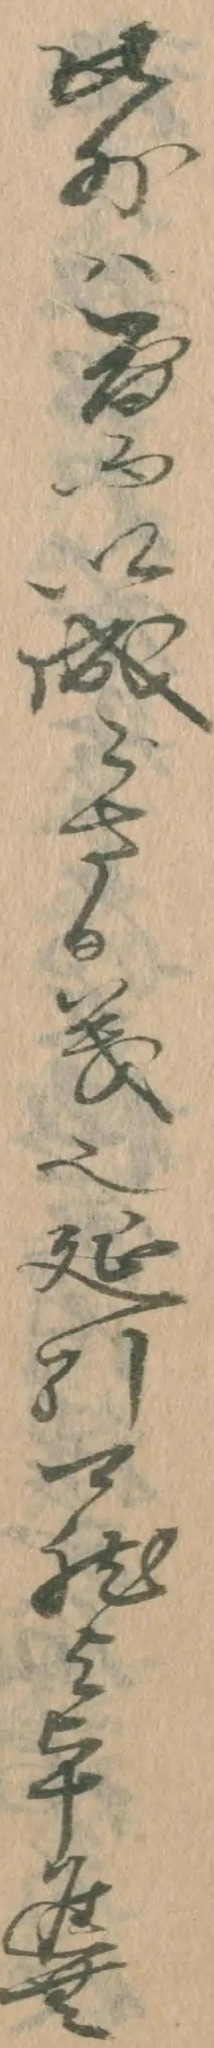此外は曽而以成らさる義也延引可然と被申進無
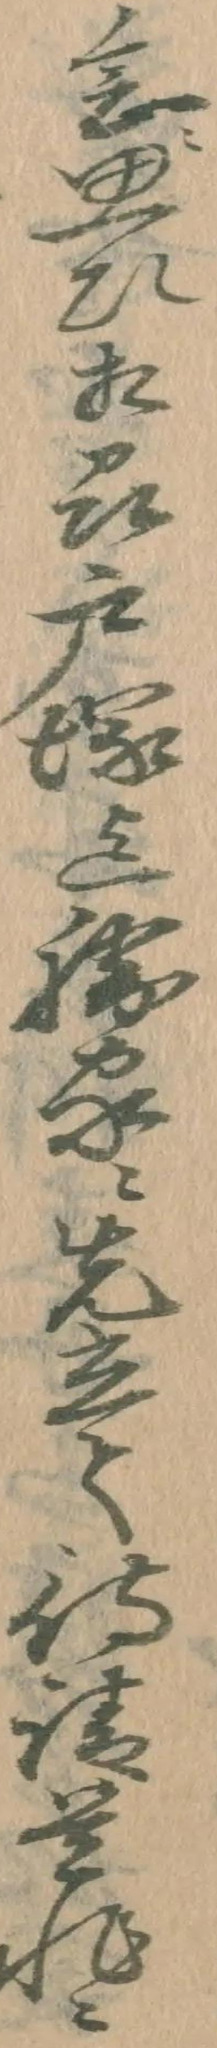念に思ひ相州戸塚迄勝家に先立て待請是非に
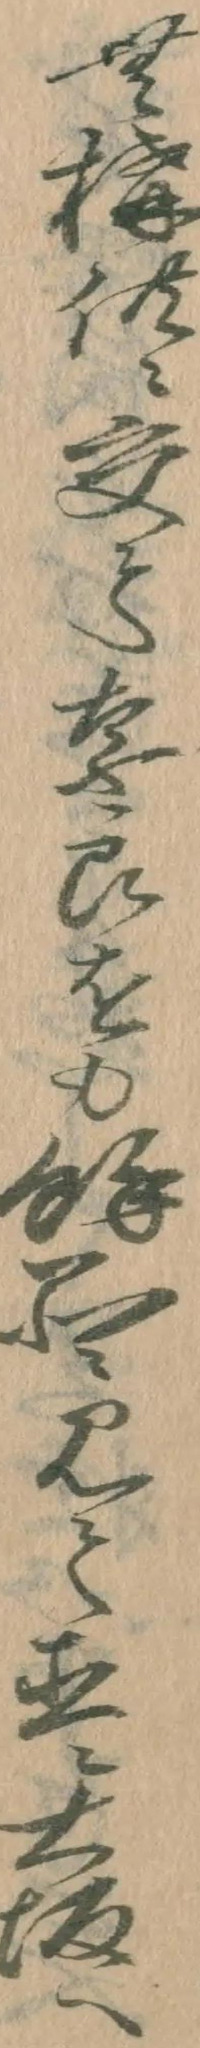無構供に交て奈良をも余所に見て直に大坂へ
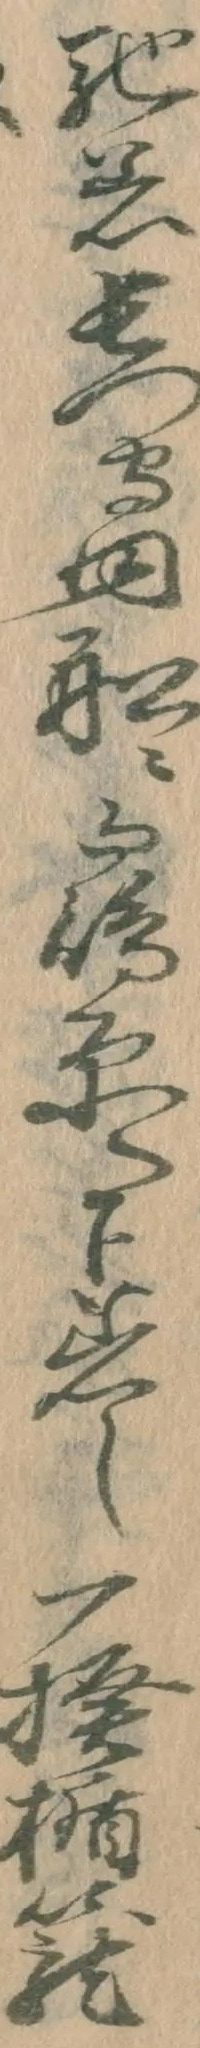馳着長門守同船に而島原へ下着し一揆楯籠
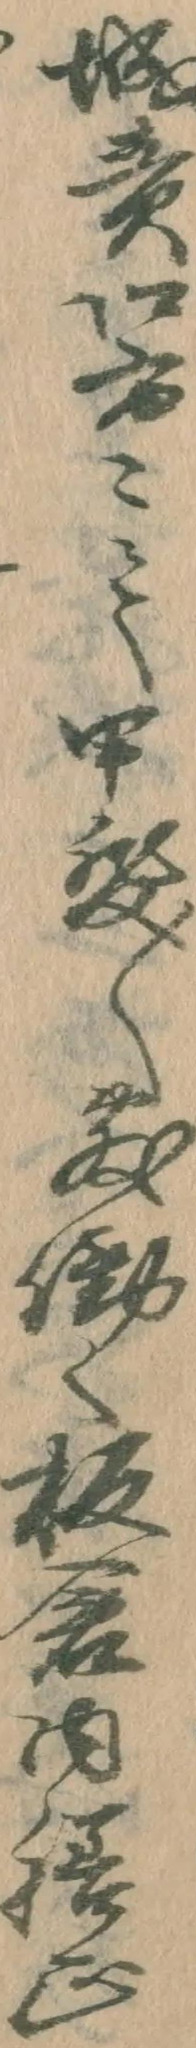城責御方にて甲斐〳〵敷働く板倉内膳正
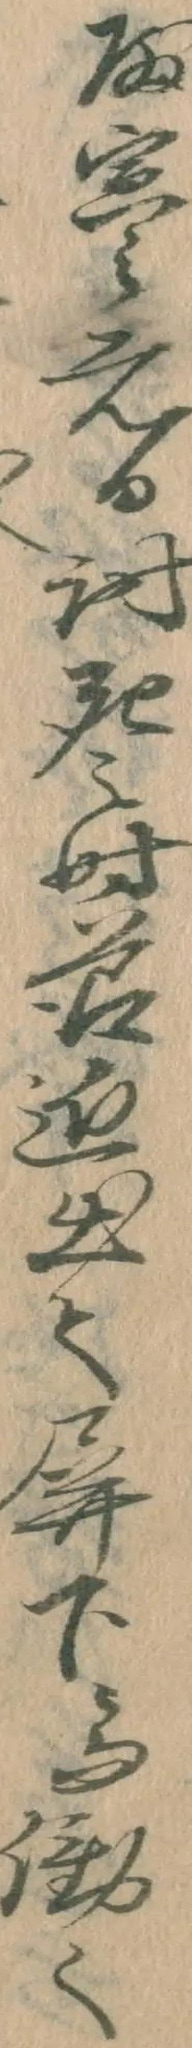殿寅之元旦討死之時節進出て屏下に働く
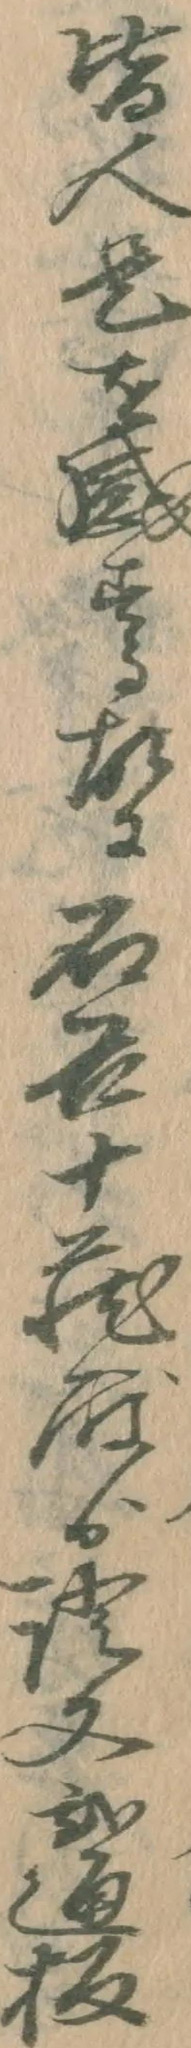皆人是を感する故に石谷十蔵殿ゟ証文弐通板
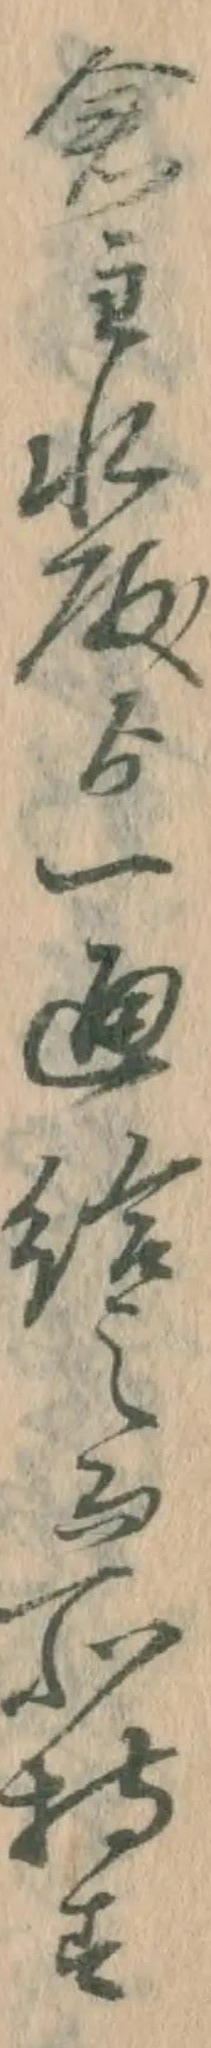倉主水殿ゟ一通給之而所持す
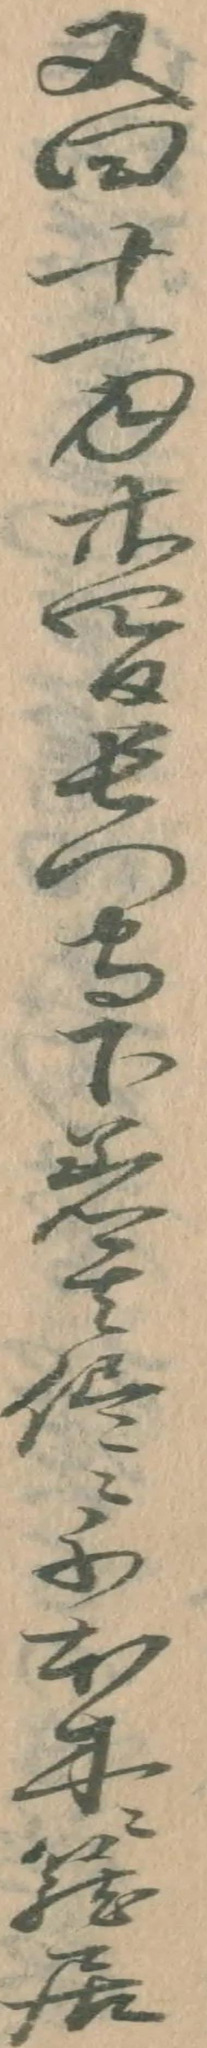又曰十一月廿四日長門守下着其儘に千本木に籠居
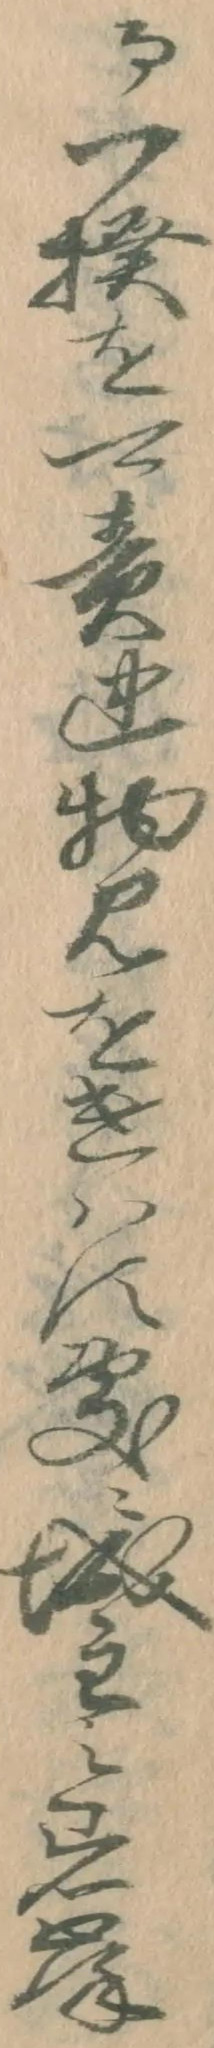る一揆を可責迚物見を遣はす処に城主の着岸

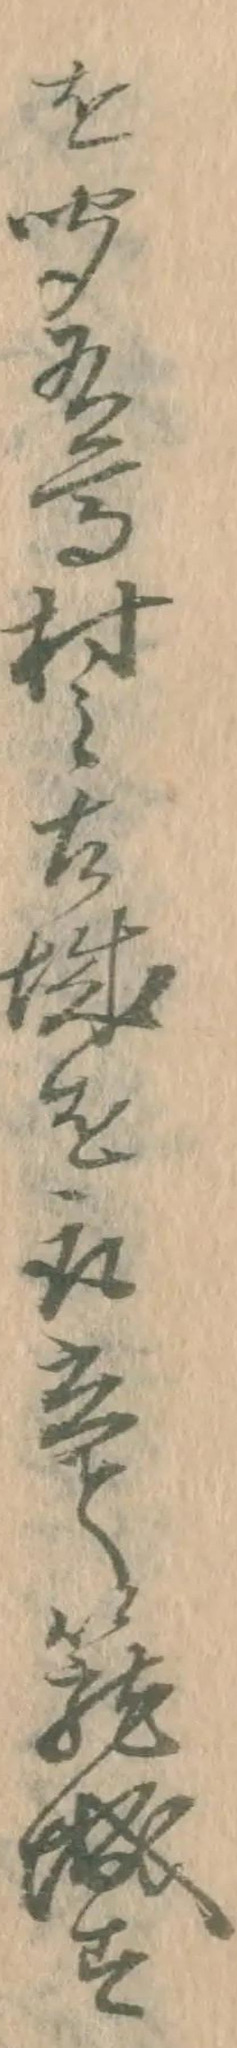を聞有高村之古城を取立て籠城す
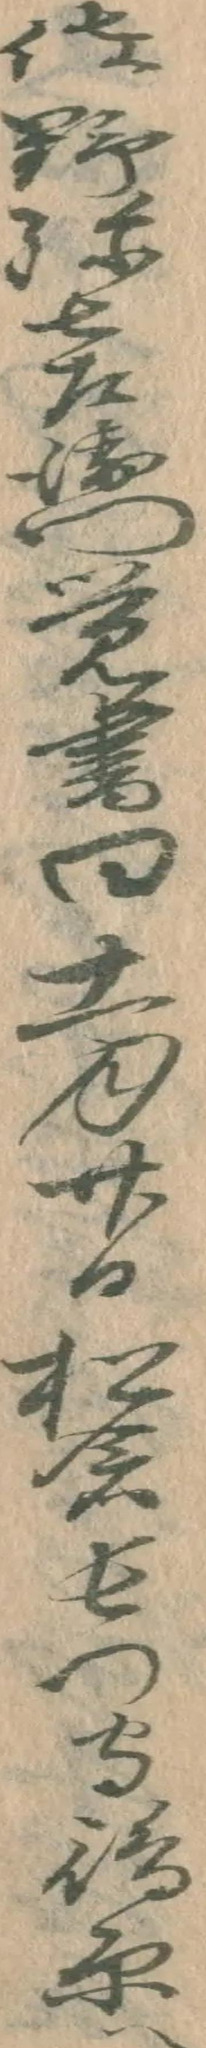佐野弥七左衛門覚書曰十一月廿日松倉長門守島原へ
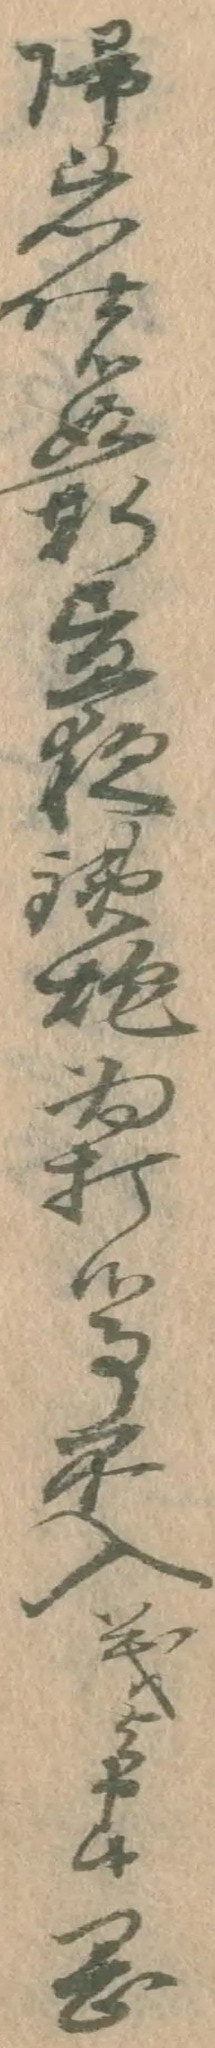帰着仕候如斯昼夜鉄炮為打候事不入義と申候岡
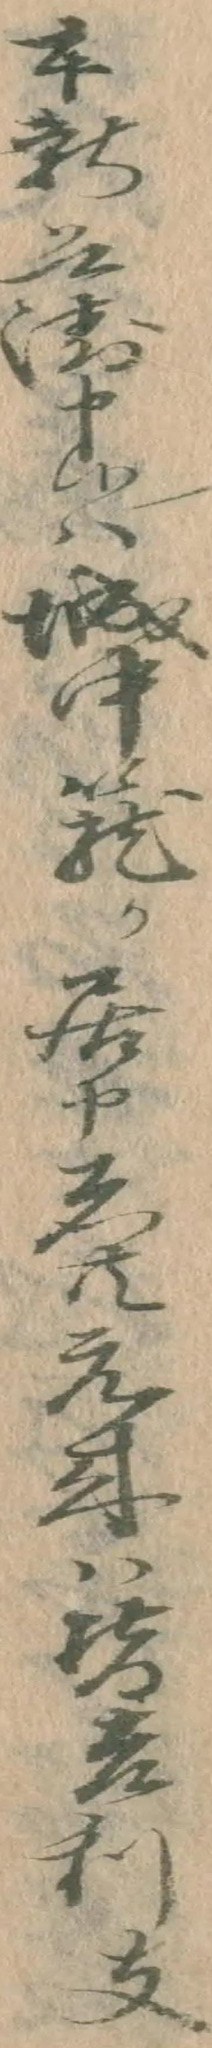本新兵衛申候は城中籠り居申者共元来は皆吉利支
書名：切支丹御退治記 49巻. [3]
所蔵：国立国会図書館 National Diet Library, JAPAN
